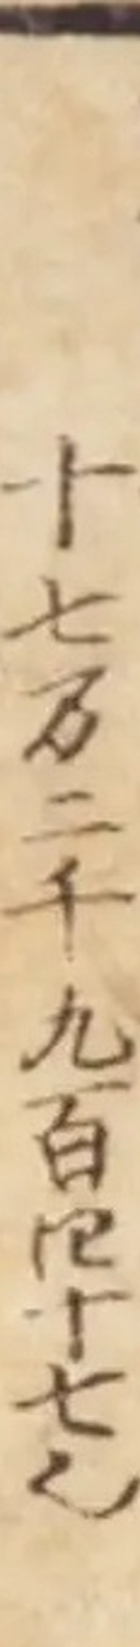十七万二千九百四十七也
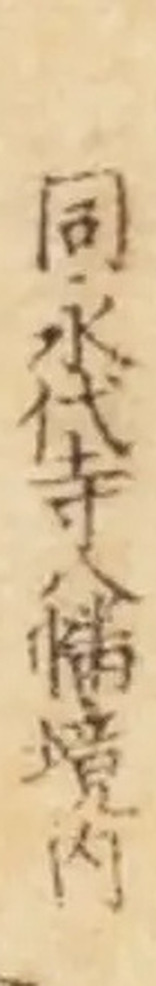同永代寺八幡境内
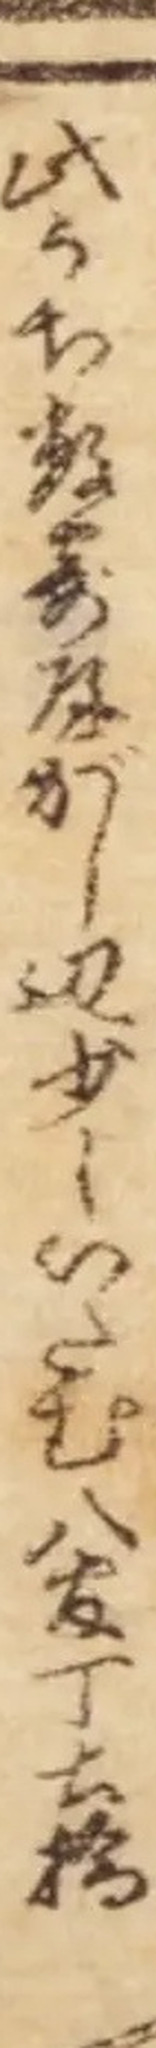此うち数寄屋がし辺少しいたむ八官丁土橋
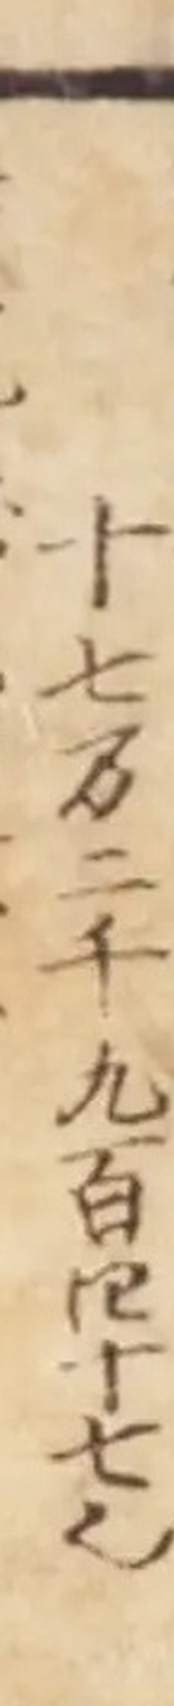十七万二千九百四十七也
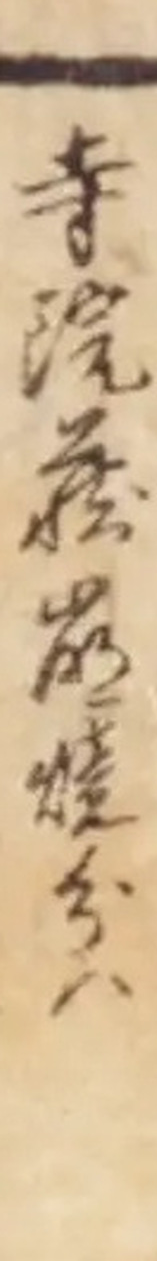寺院蔵崩焼分は
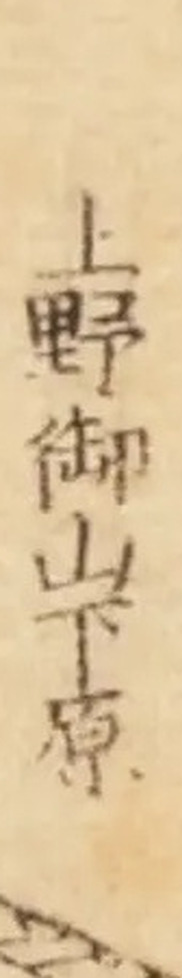上野御山下原
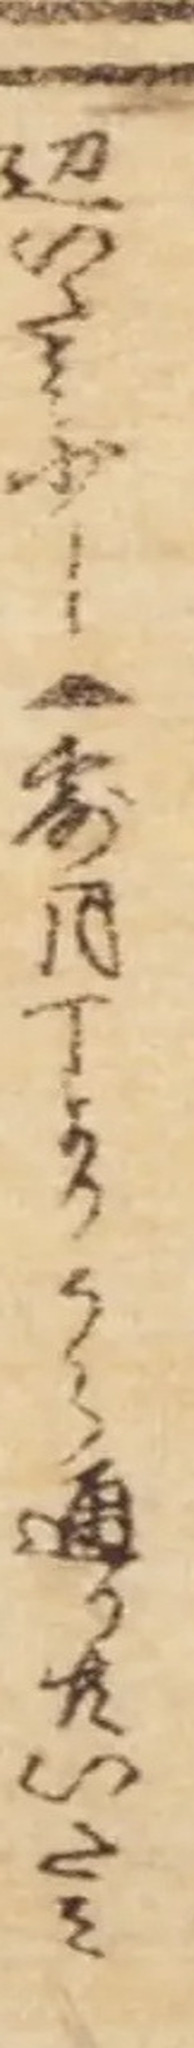辺いたみ少し▲露月丁よりうら通り共いたみ
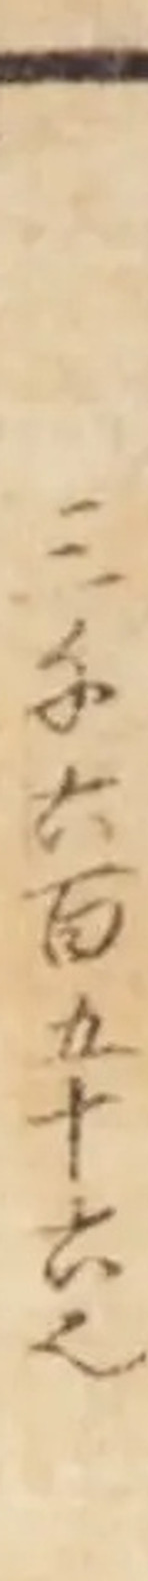三千六百五十六也
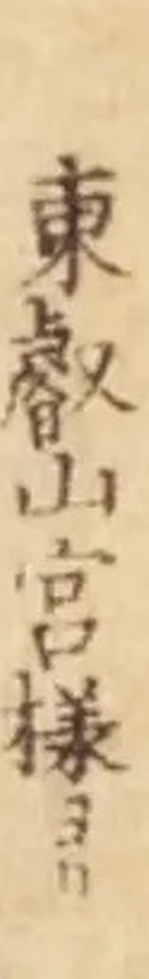東叡山宮様より
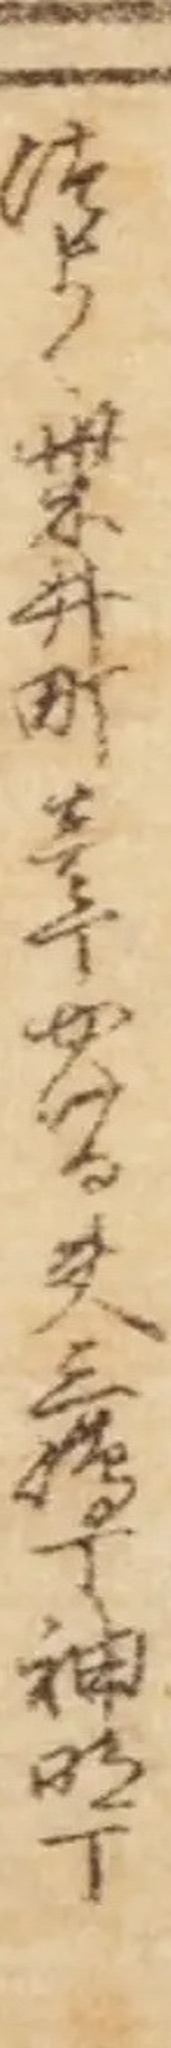つよく柴井町壱丁やける夫三島丁神明丁
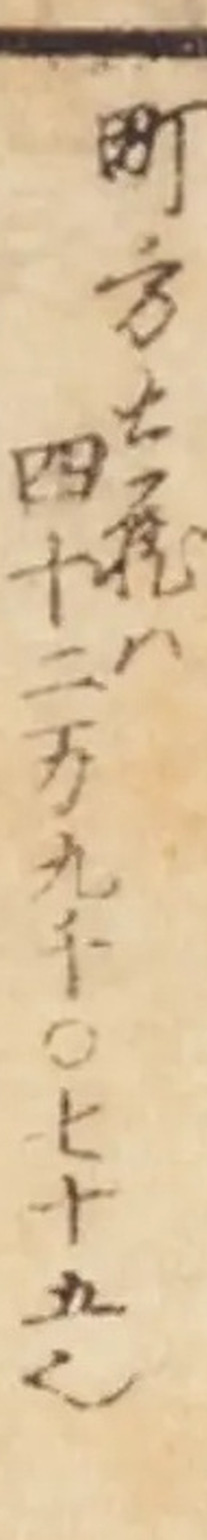四十二万九千〇七十五也
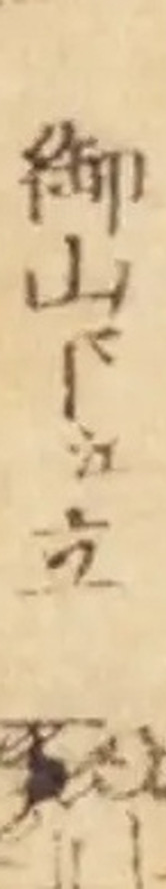御山下江立
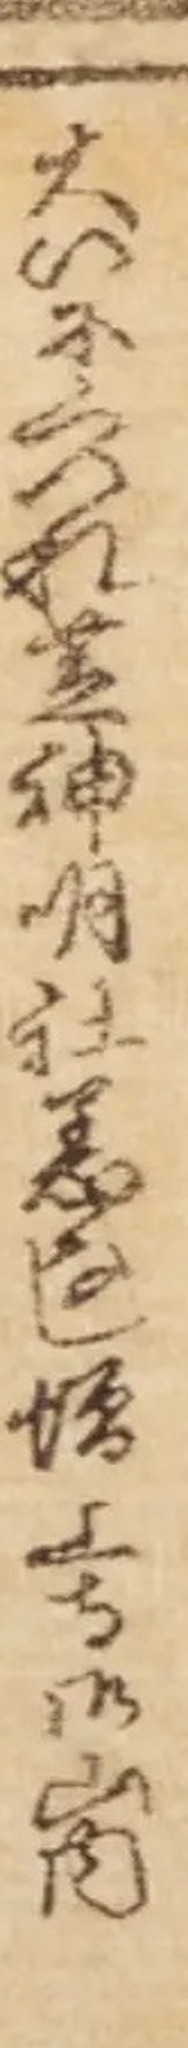大いにつばれ芝神明社恙なし増上寺御山内
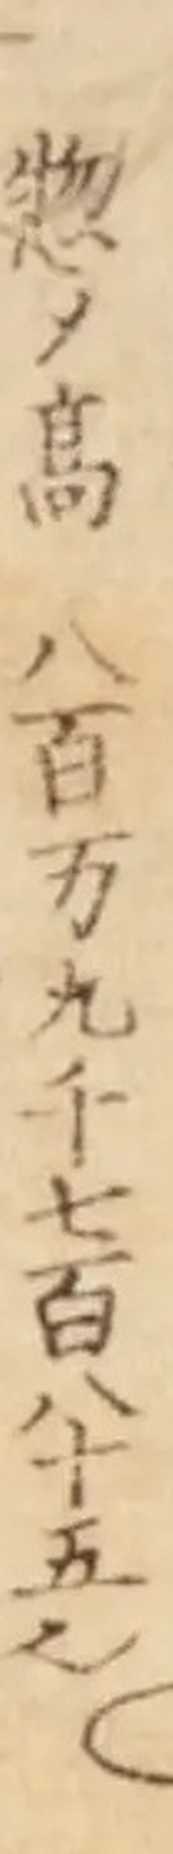惣〆高八百万九千七百八十五也
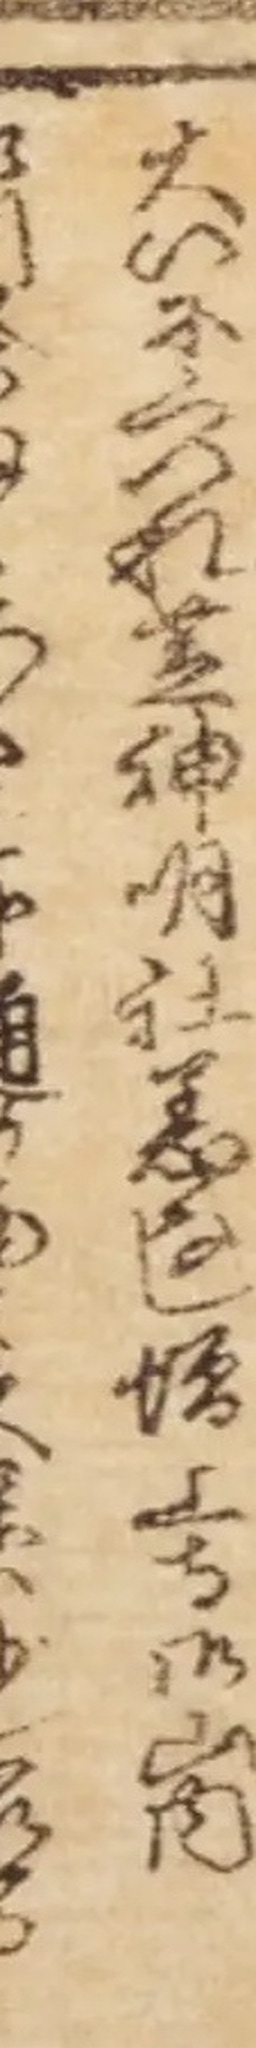御別条なくあたご下通り西之久保は少し崩る
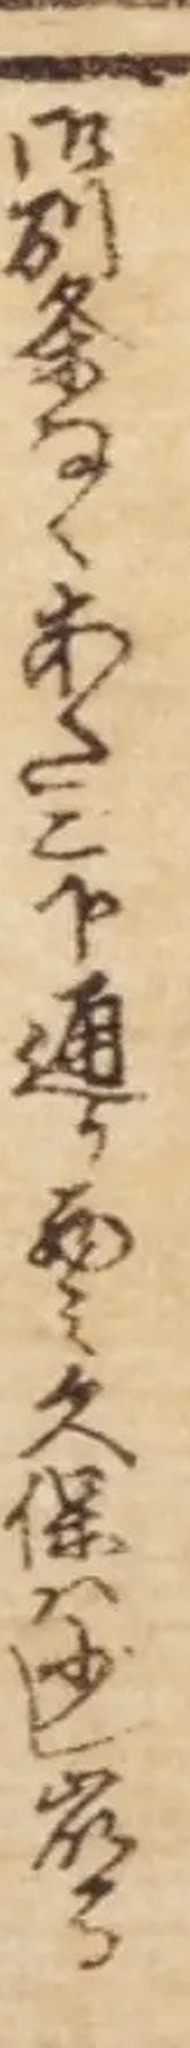御別条なくあたご下通り西之久保は少し崩る
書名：御江戸関八州大地震出火巨細記
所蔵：国立国会図書館 National Diet Library, JAPAN
